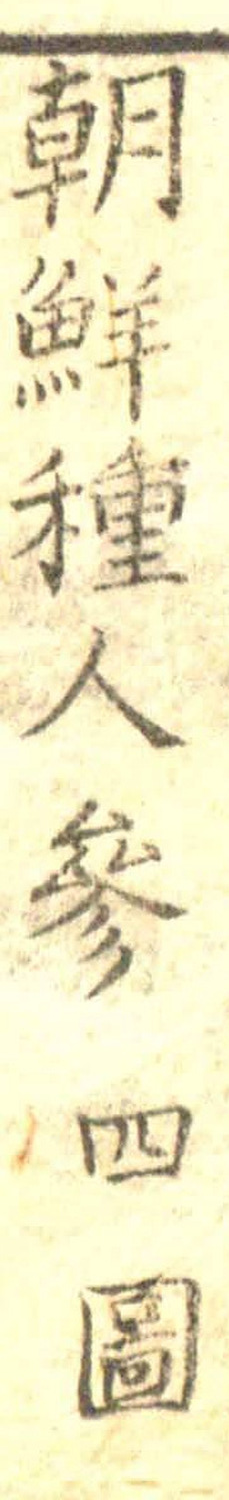朝鮮種人参四図
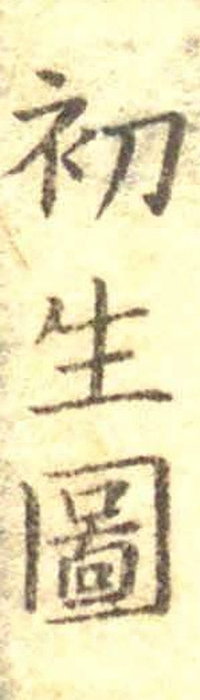初生図
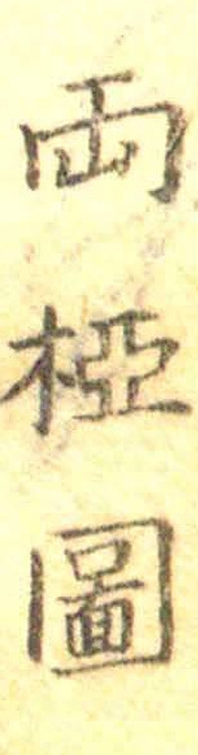両椏図

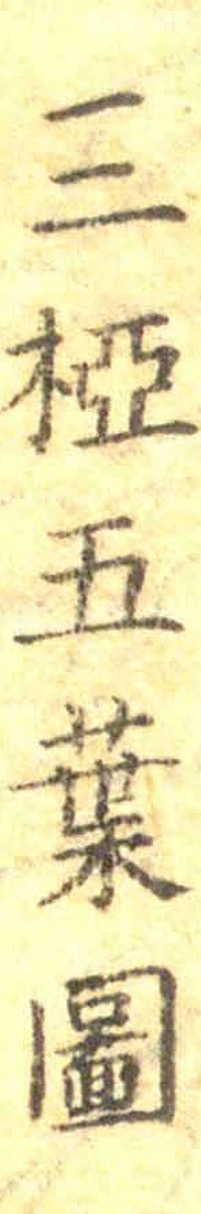三椏五葉図

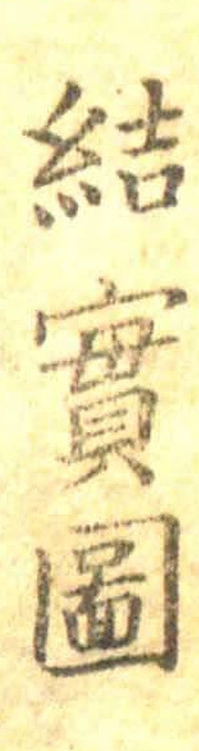結実図

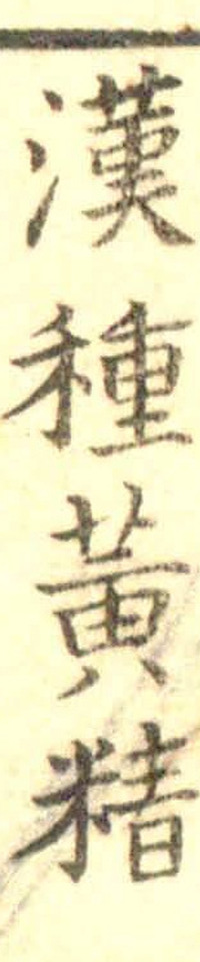漢種黄精

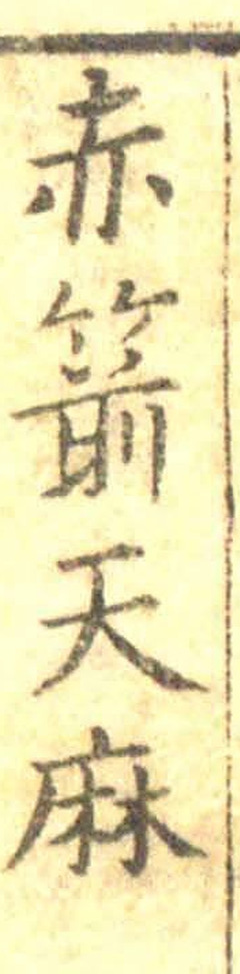赤箭天麻
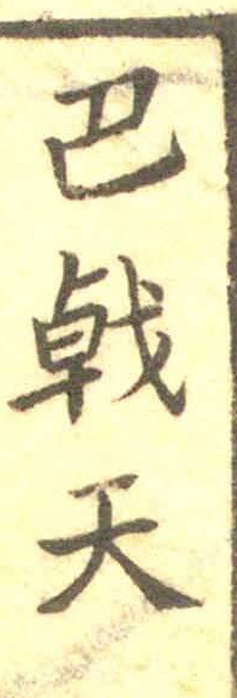巴戟天

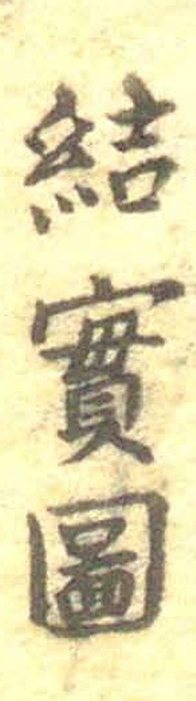結実図
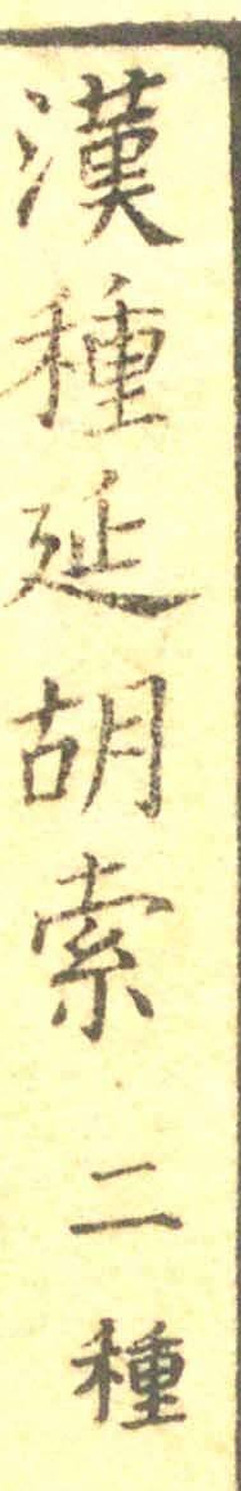漢種延胡索二種

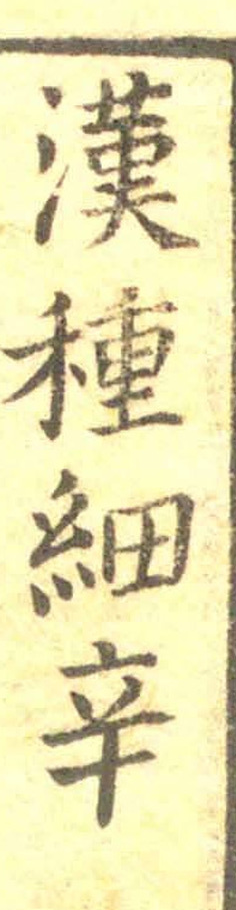漢種細辛

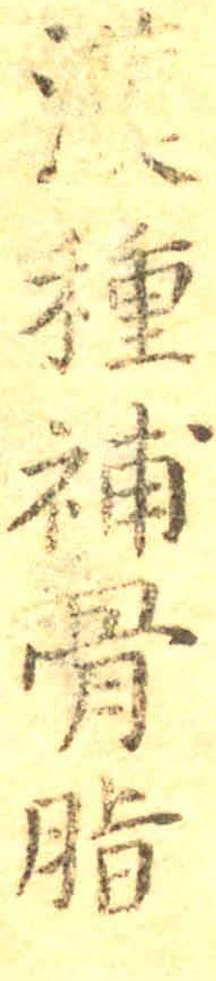漢種補骨脂
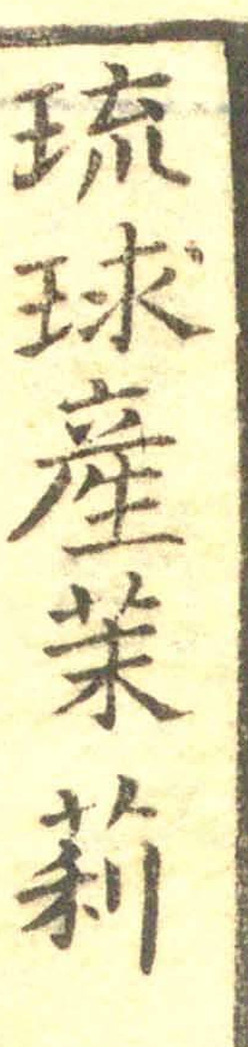琉球産茉莉

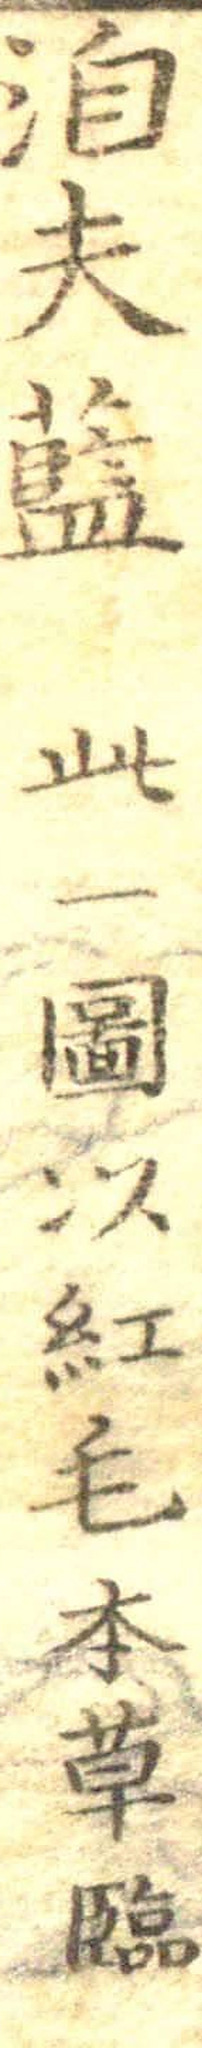洎夫藍此一図以紅毛本草臨

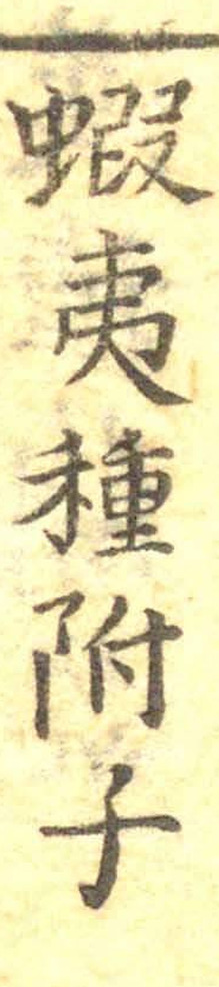蝦夷種附子
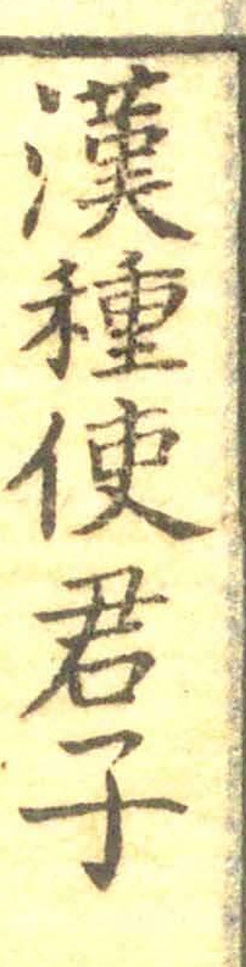漢種使君子
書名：物類品隲
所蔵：国文学研究資料館
